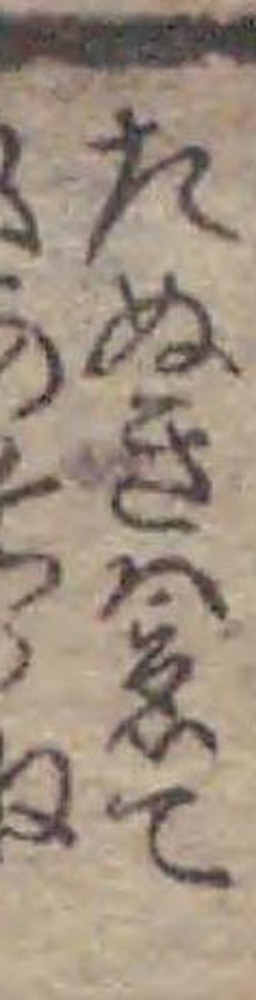かたのそらね
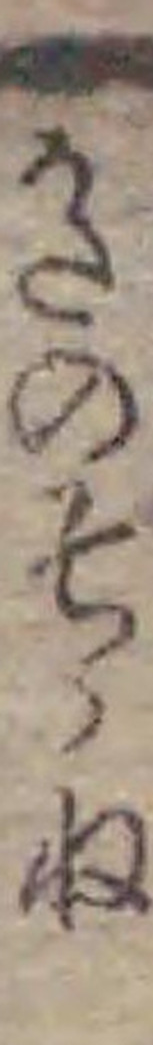かたのそらね
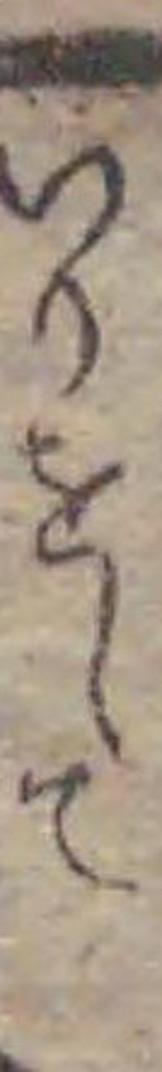いりをして
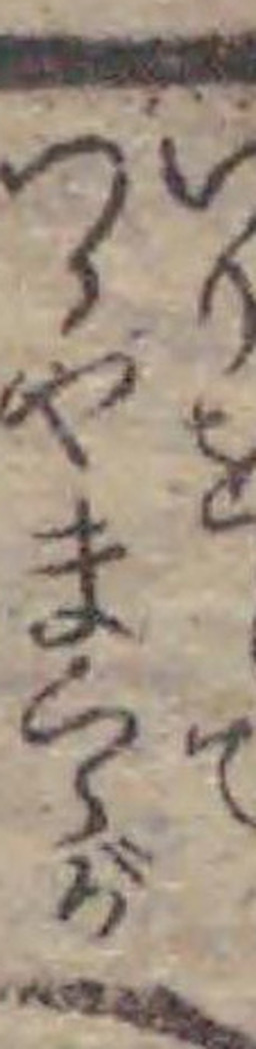つらやまくらが
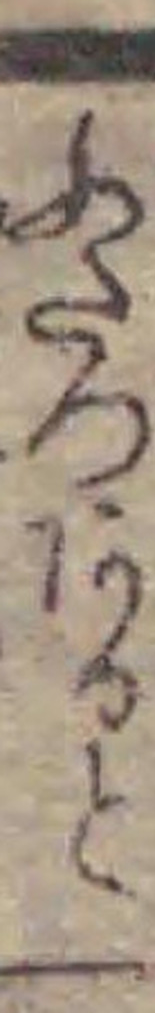ふたつあると
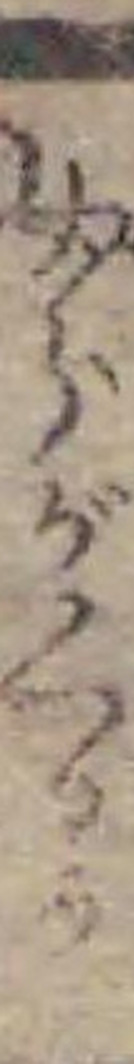女郎がくるか
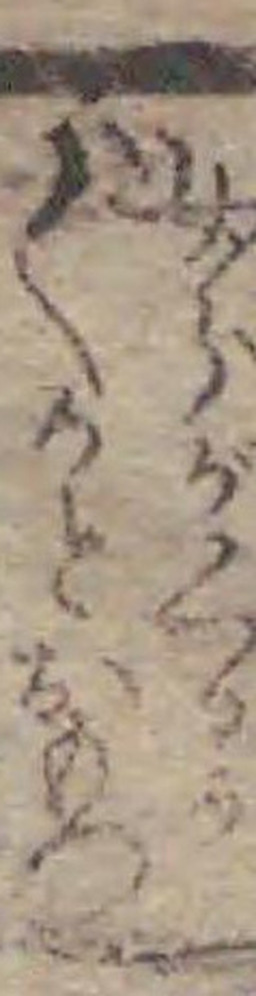〳〵かとおもつ
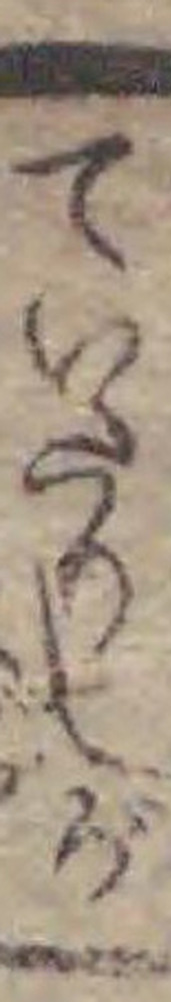ていたりしが
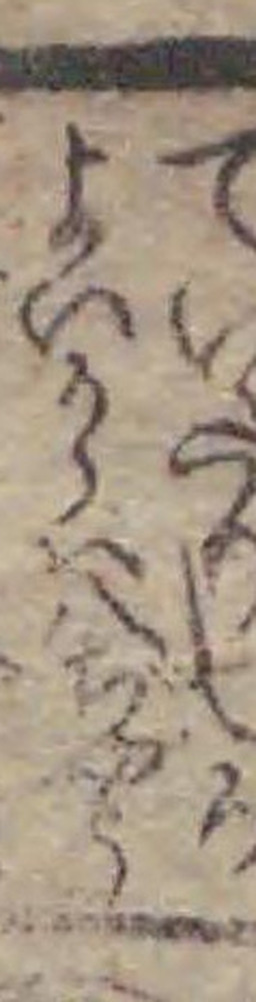よいからは八じやう
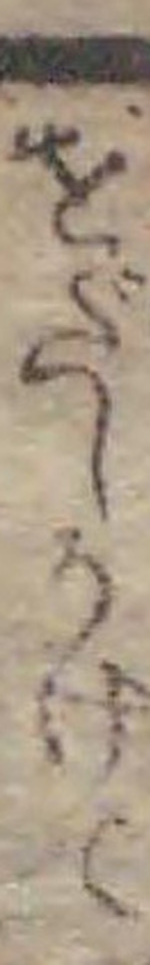をだしかけて
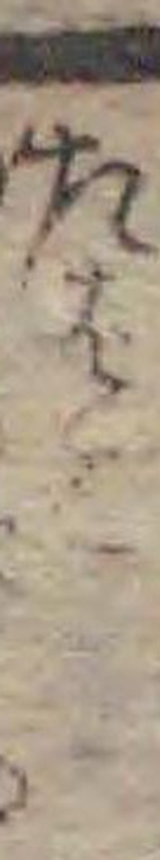たばこ
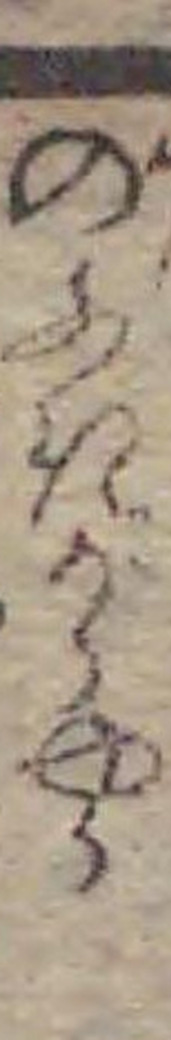のふきがらやら
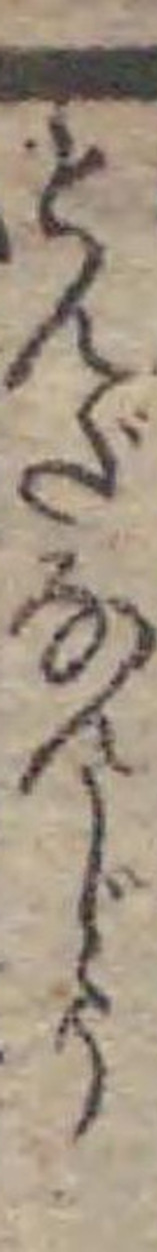とんだなんじう
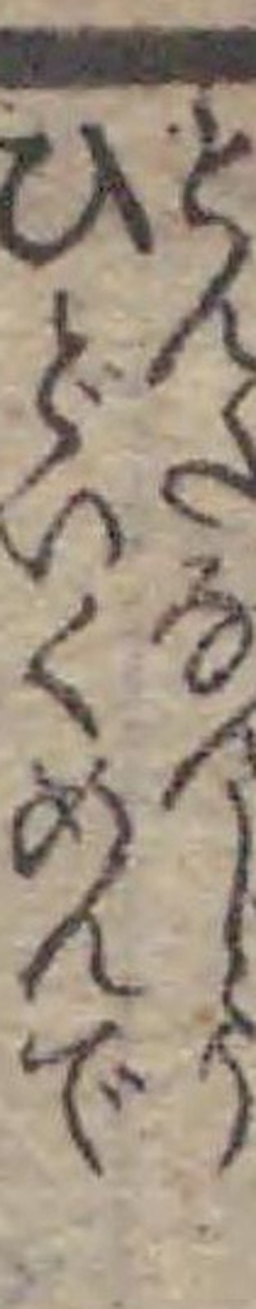ひどいくめんで
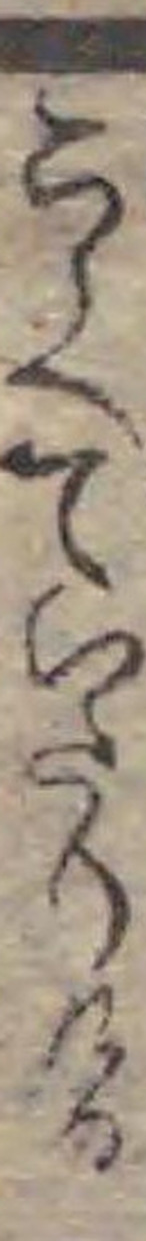こらへていたりける
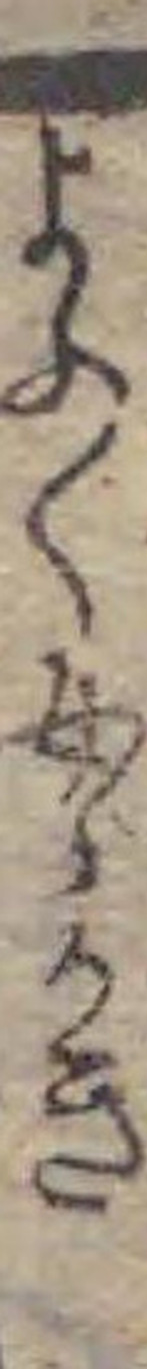よふ〳〵女郎かき
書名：化物楽屋異牒 : 2巻
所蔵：国立国会図書館 National Diet Library, JAPAN
